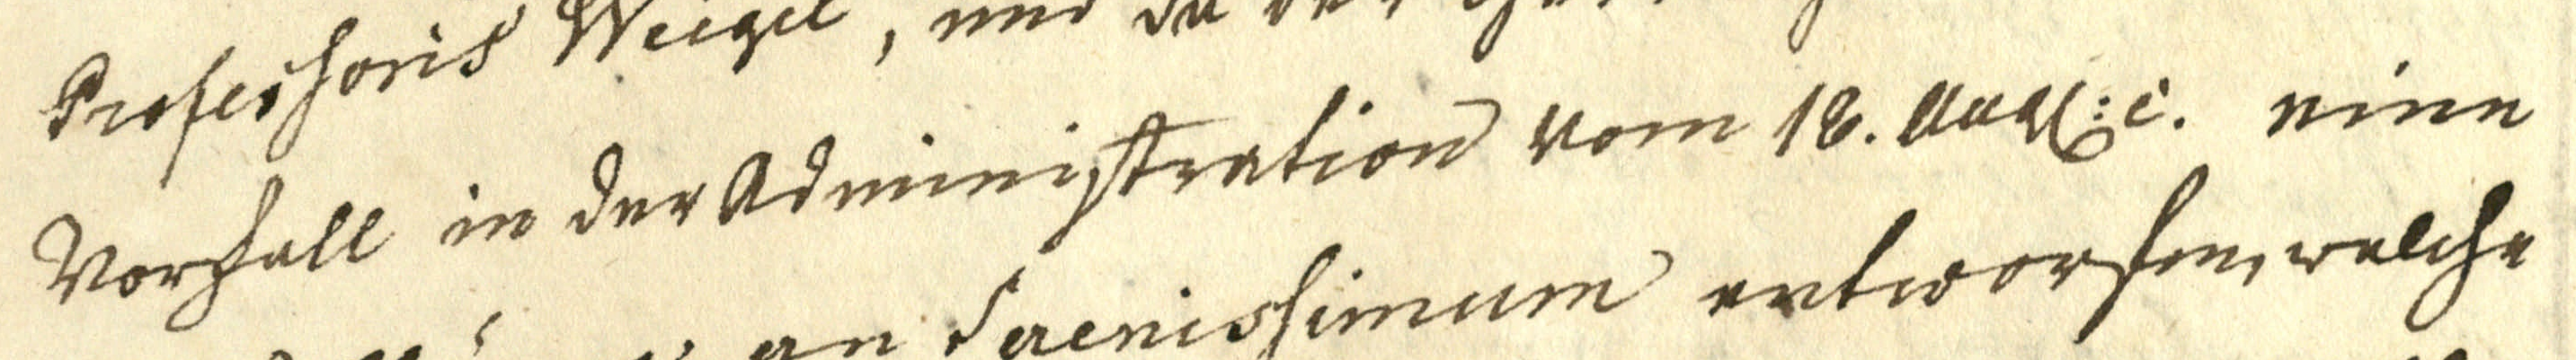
Vorfall in der Administration vom 18. Aug. c. eine
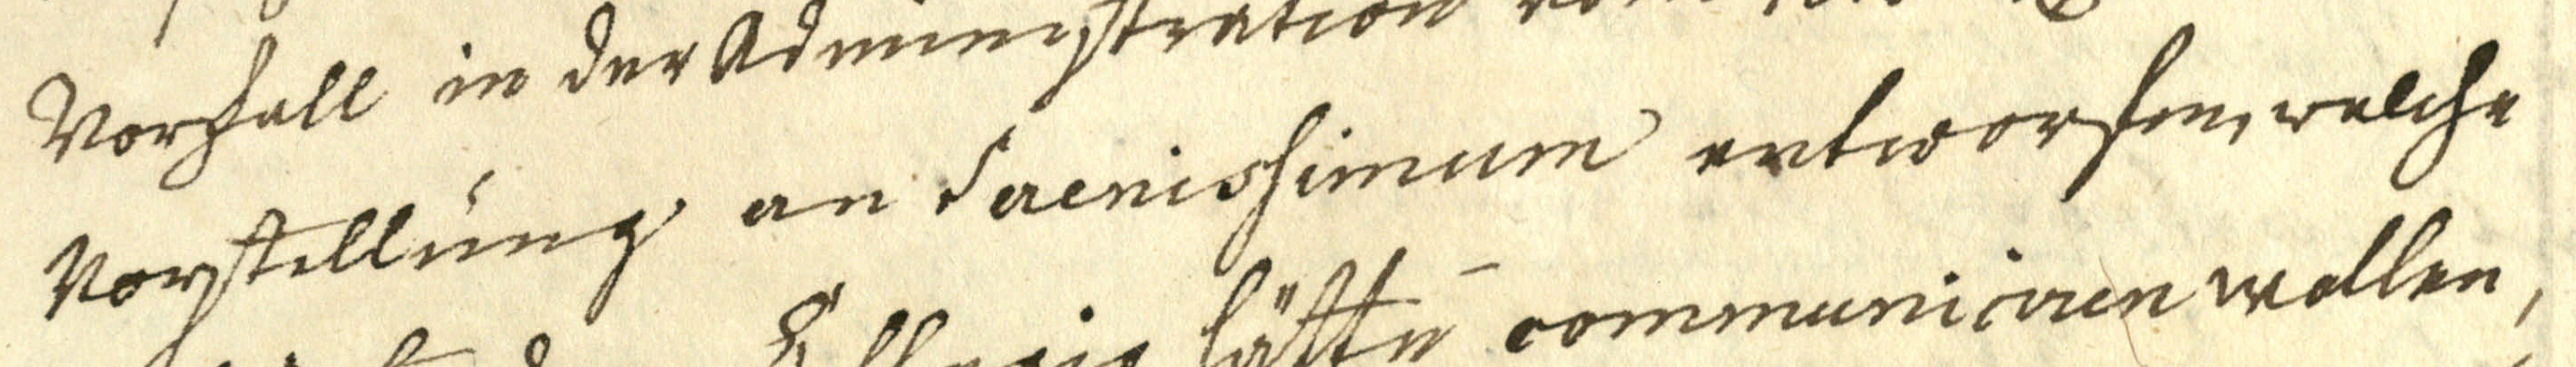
Vorstellung an Serenissimum entworfen, welche
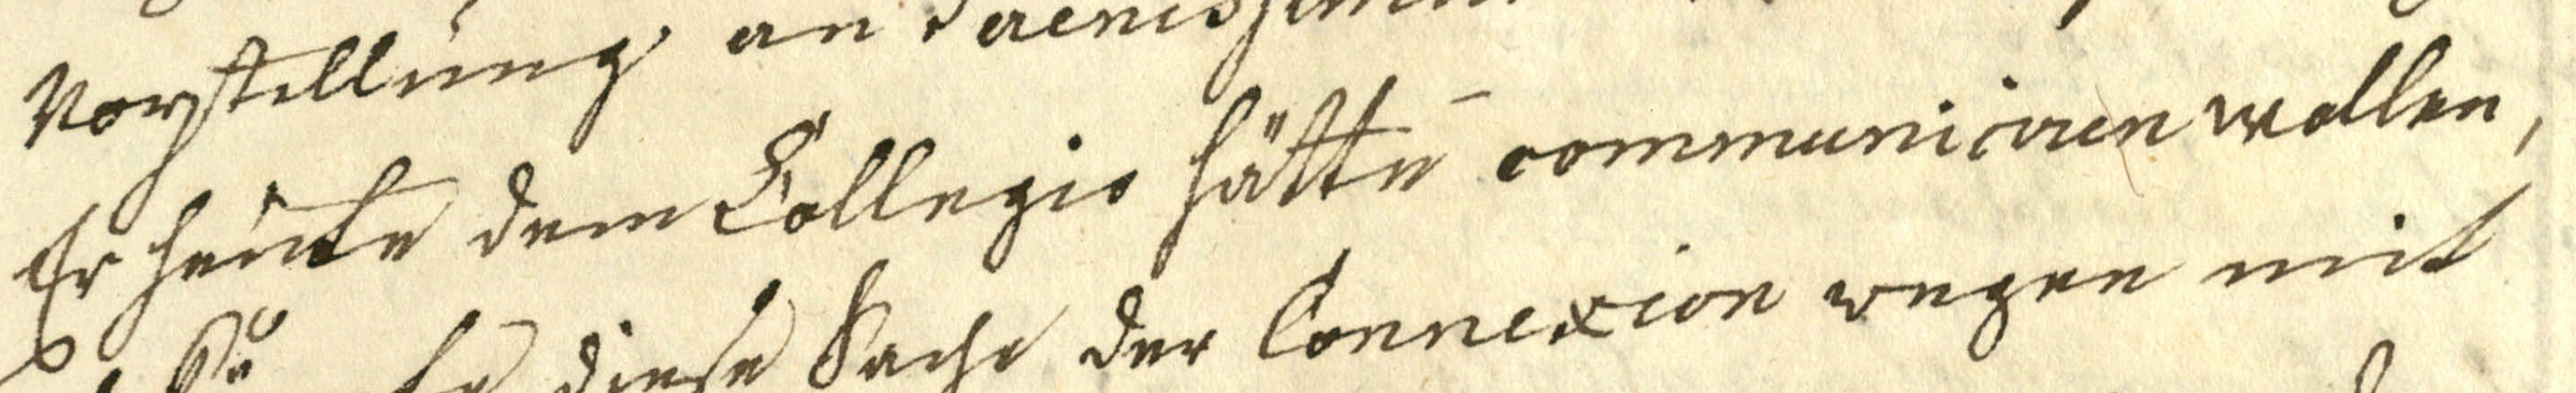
Er heute dem Collegio hätte communiciren wollen,
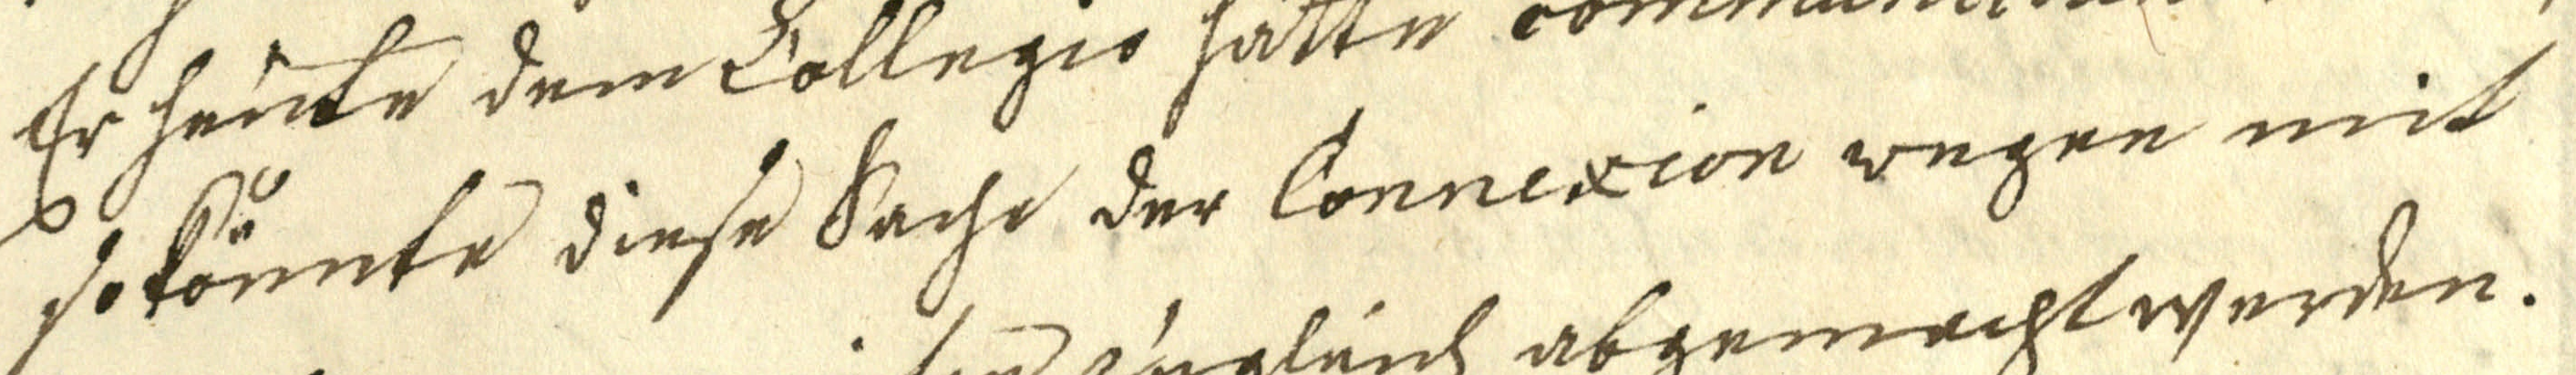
so könnte diese Sache der Connexion wegen mit
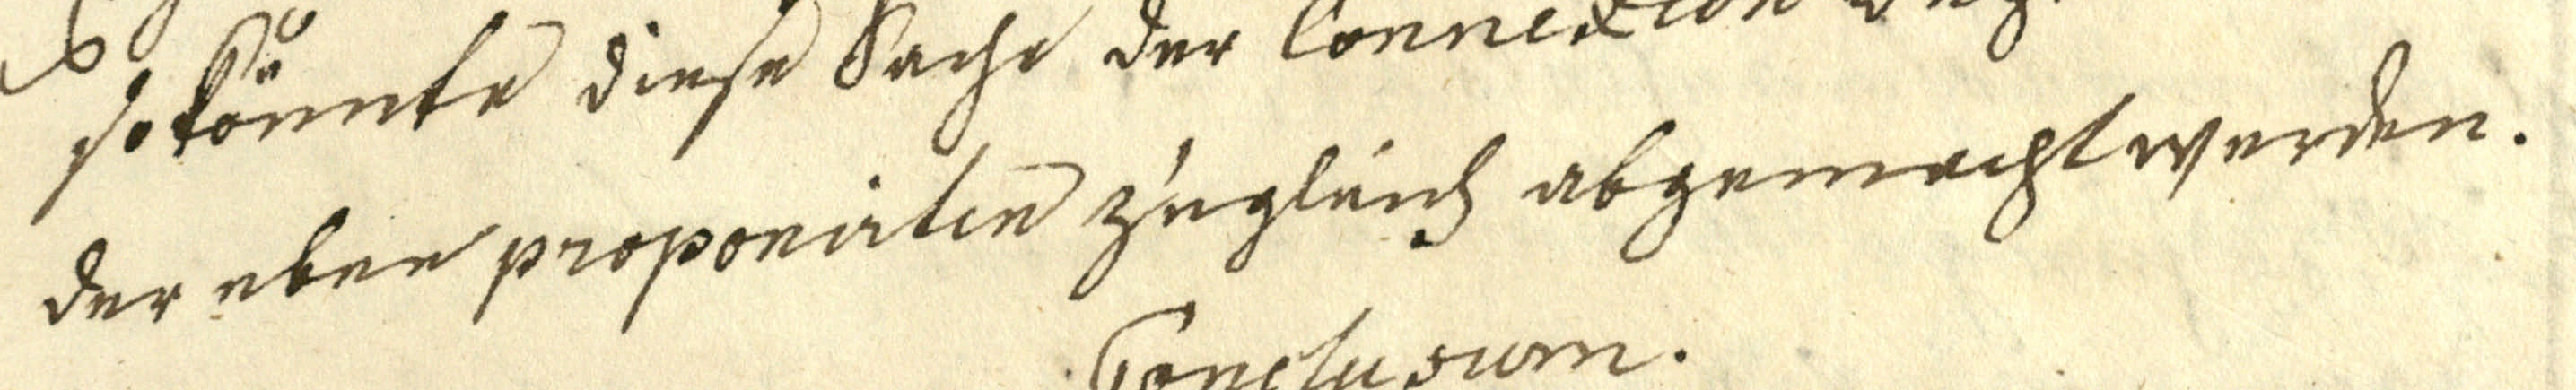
der eben proponirten zugleich abgemacht werden.
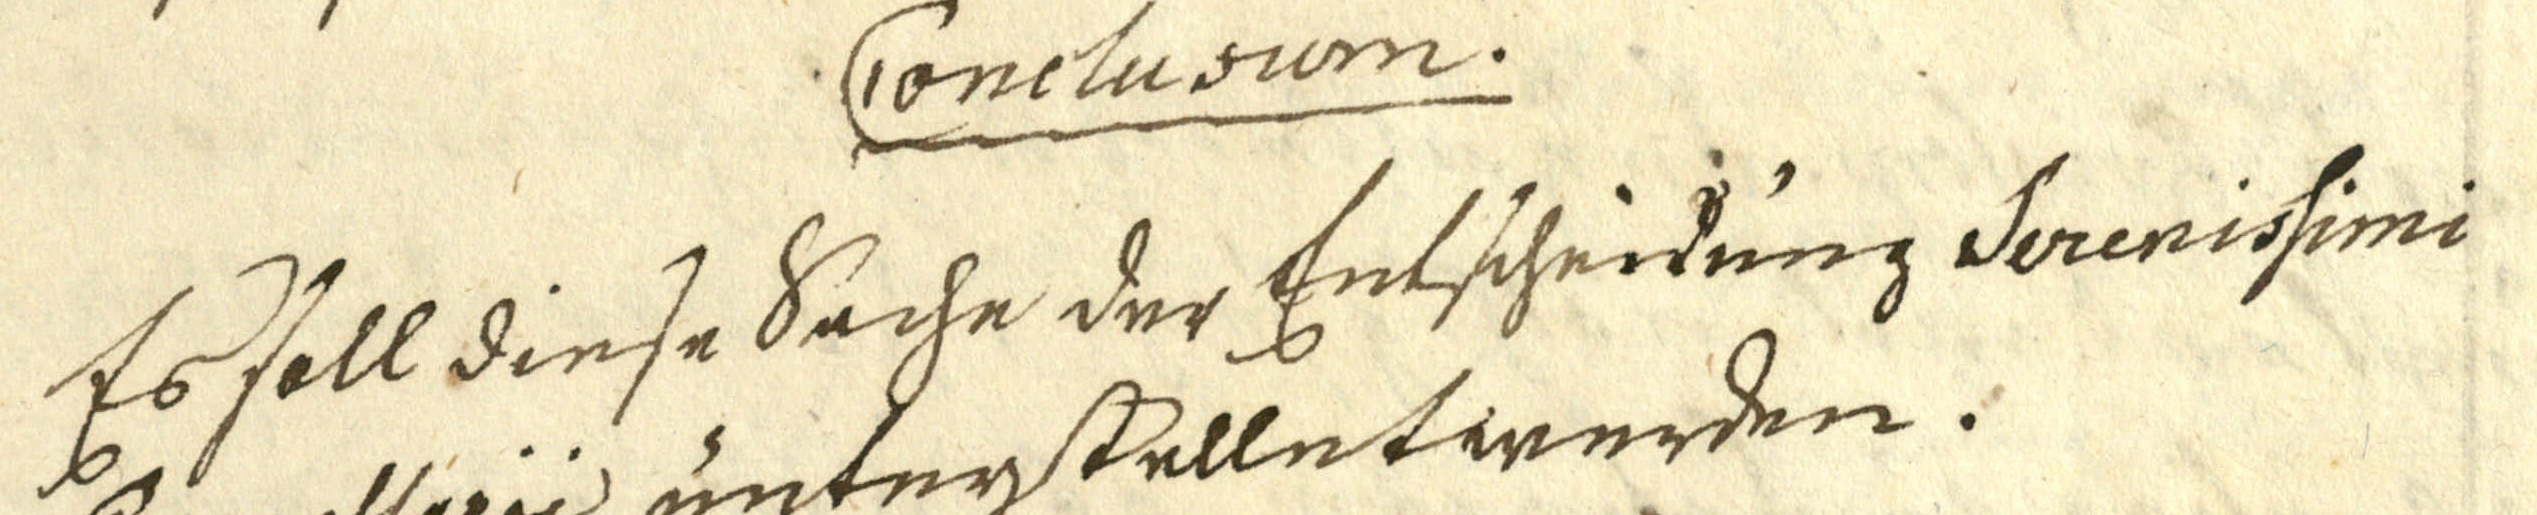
Es soll diese Sache der Entscheidung Serenissimi
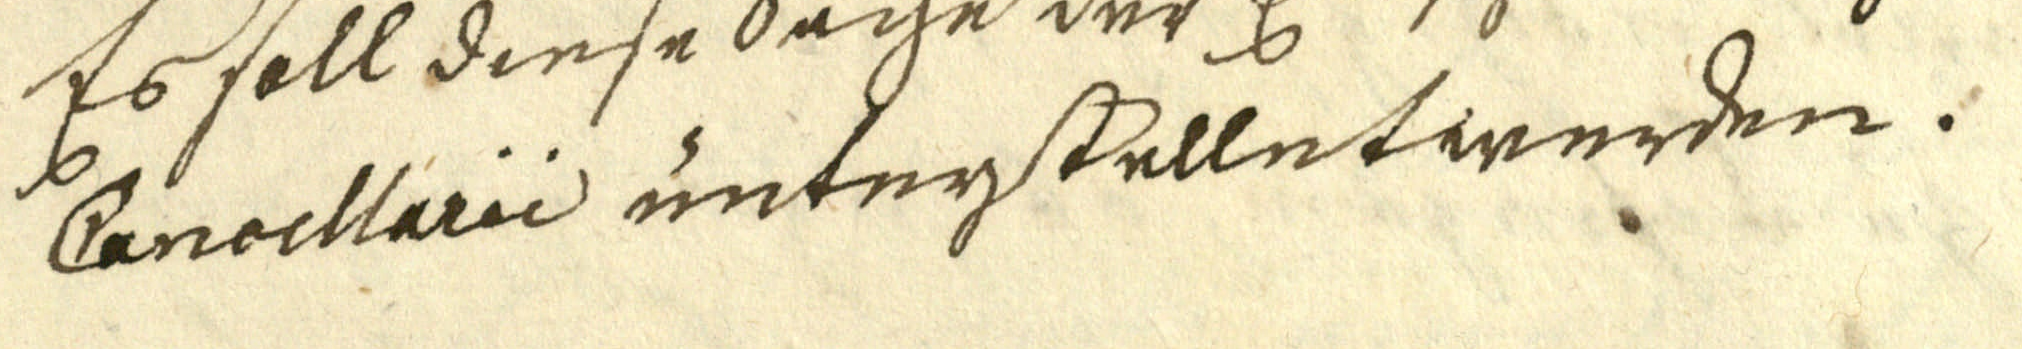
Cancellarii unterstellet werden.
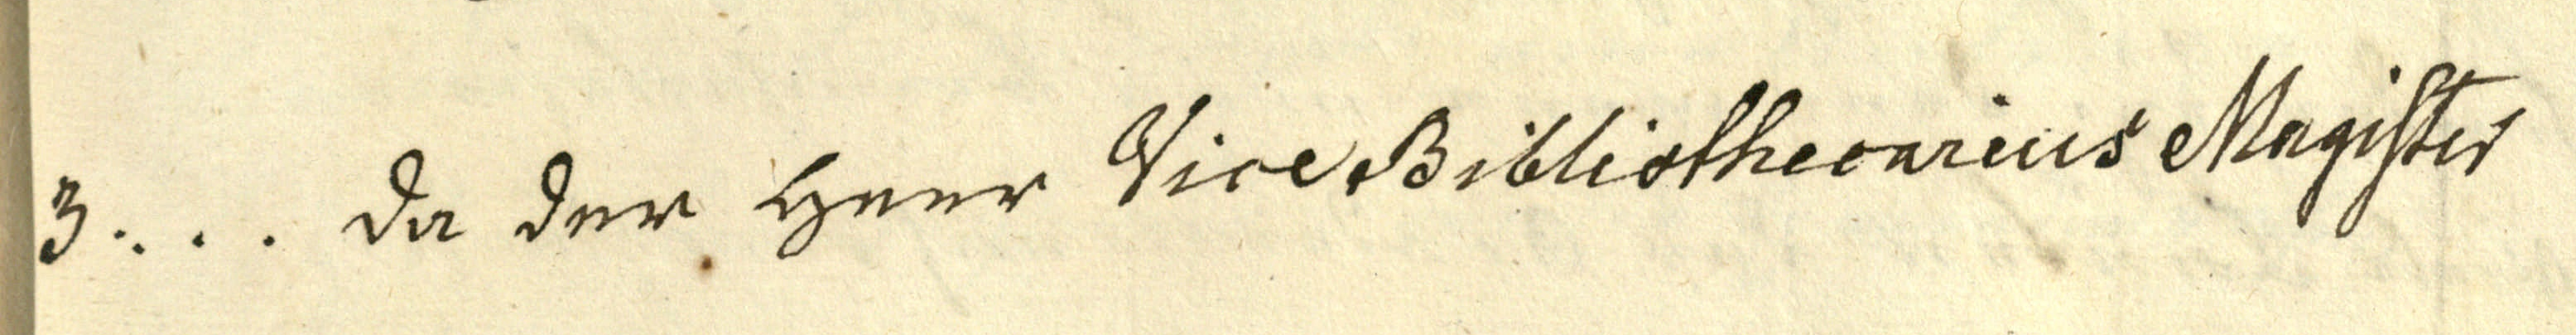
3. Da der Herr ViceBibliothecarius Magister
